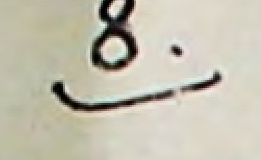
8.
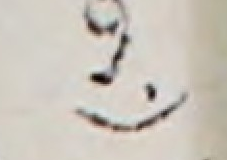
9.
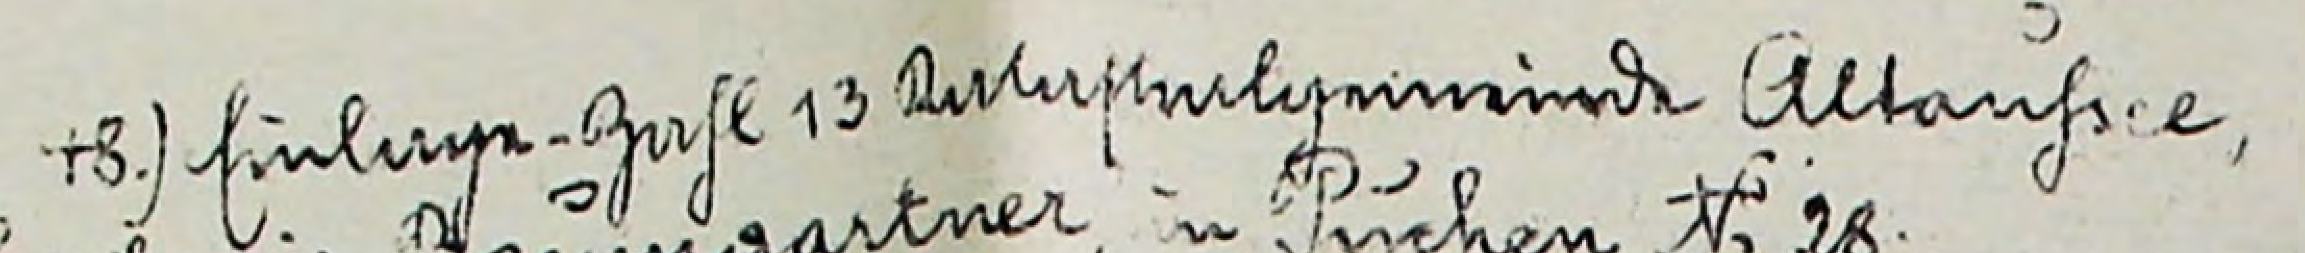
48.) Einlage - Zahl 13 Katastralgemeinde Altaussee,
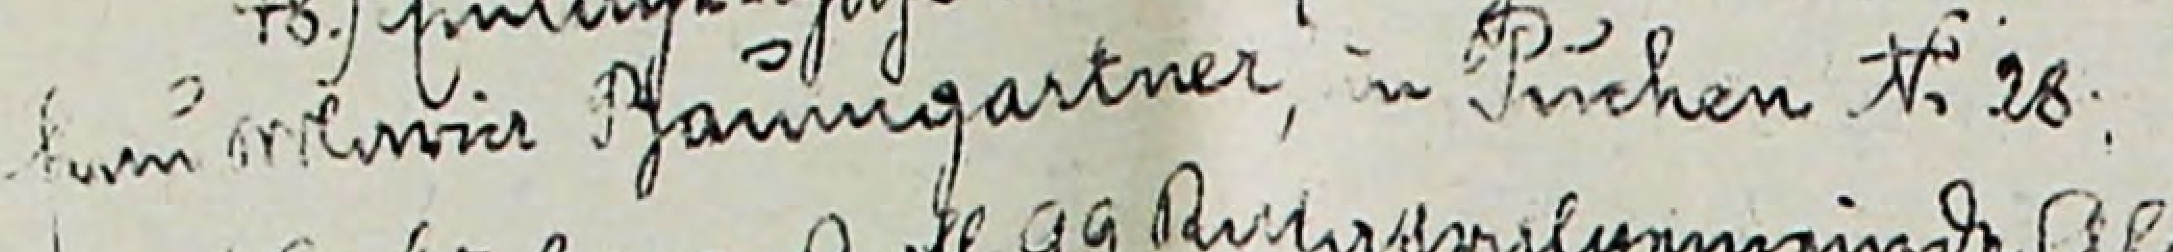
Frau Maria Baumgartner, in Puchen No 28;
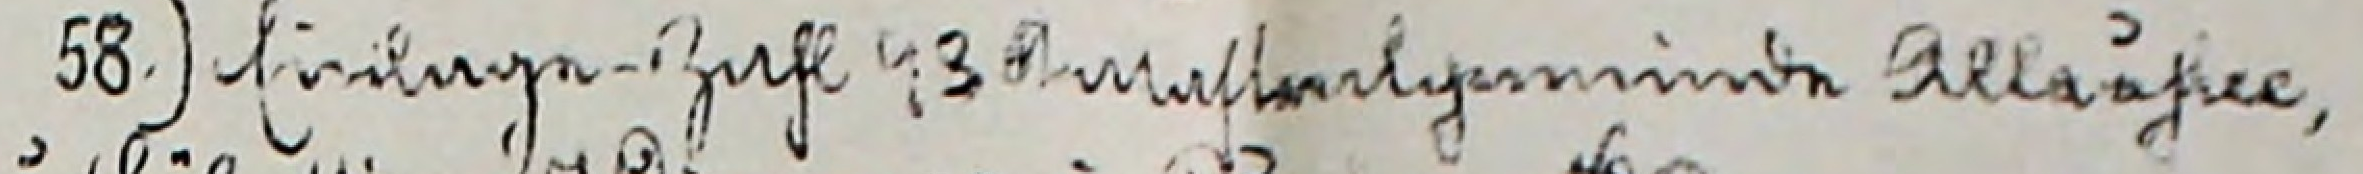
58.) Einlage - Zahl 48 Katastralgemeinde Altaussee,
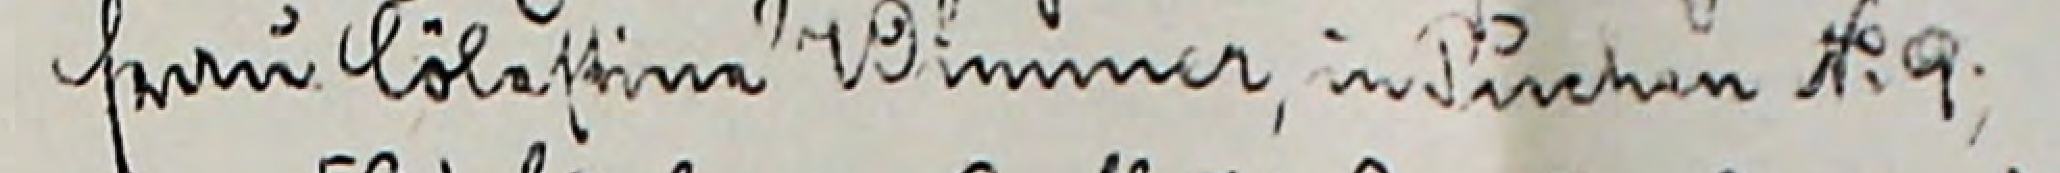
Frau Cölestine Wimmer, in Puchen No 9;
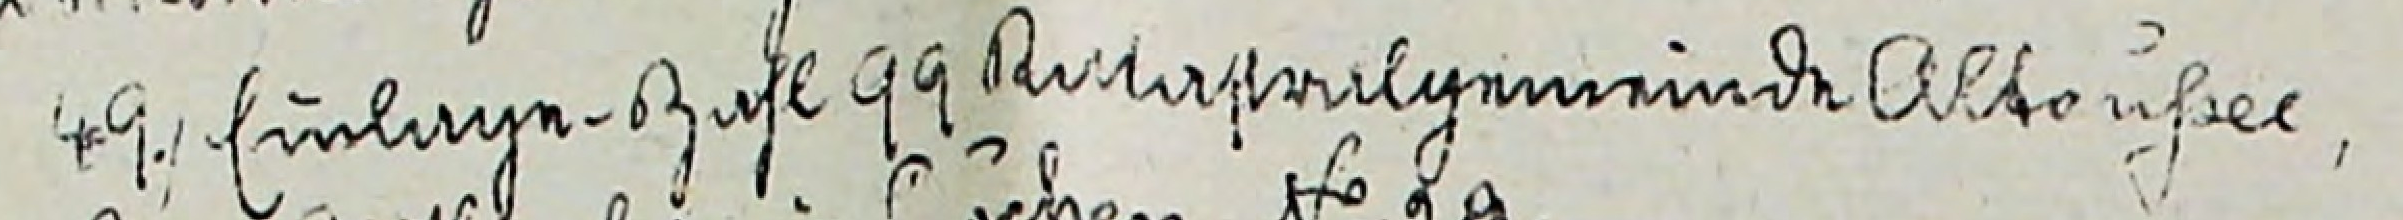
49.) Einlage - Zahl 99 Katastralgemeinde Altaussee,
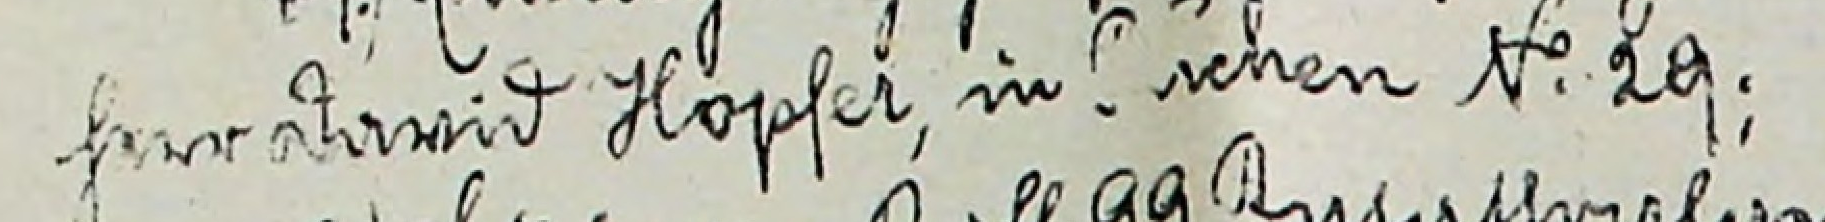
Herr David Hopfer, in Puchen No 29;
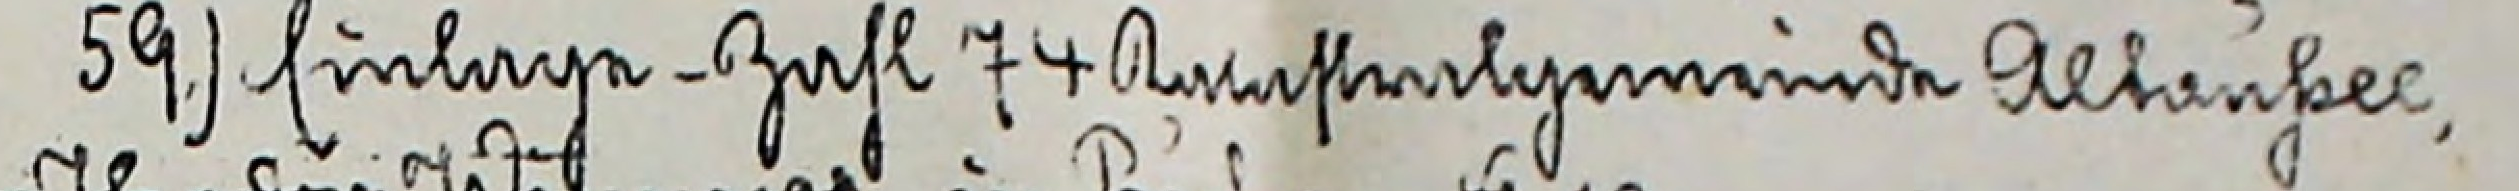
59.) Einlage - Zahl 74 Katastralgemeinde Altaussee,
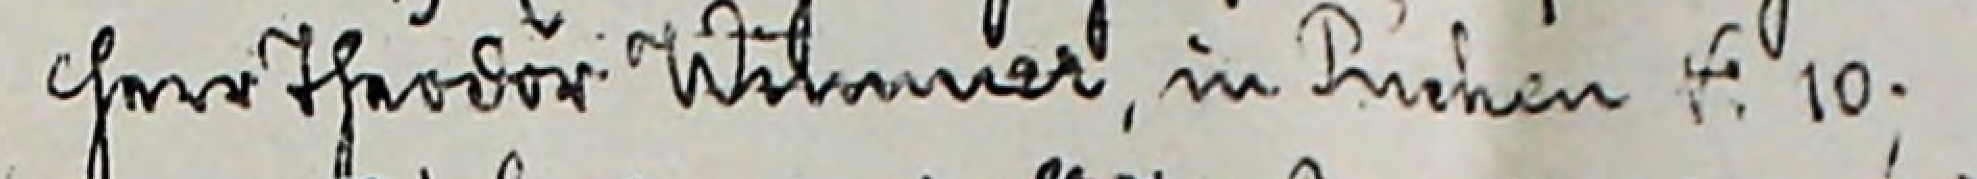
Herr Theodor Wimmer, in Puchen No 10;
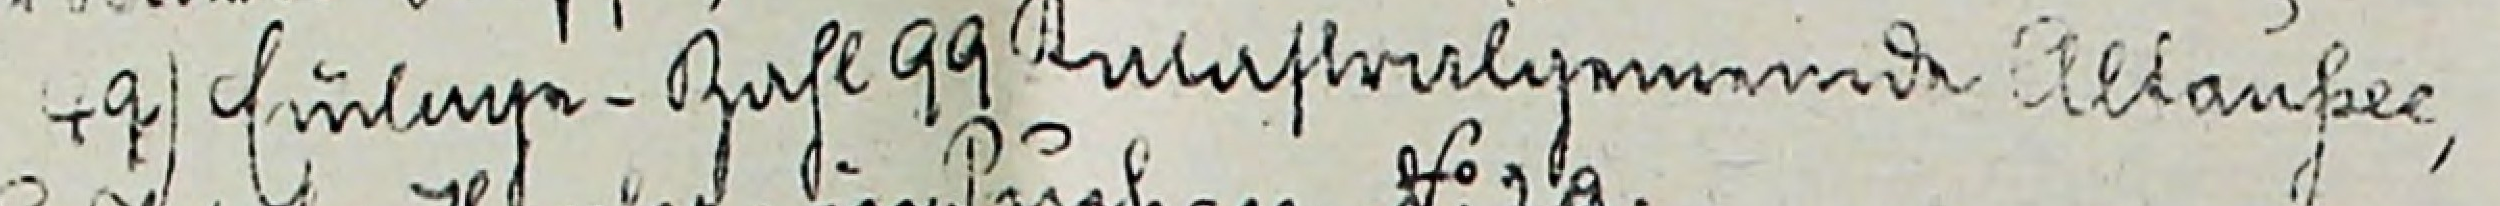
49.) Einlage - Zahl 99 Katastralgemeinde Altaussee,
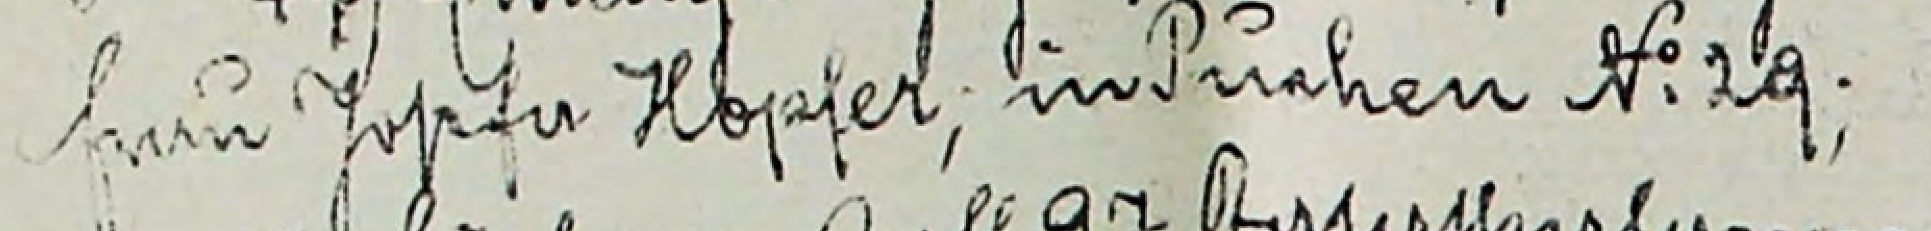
Frau Josefa Hopfer, in Puchen No 29;
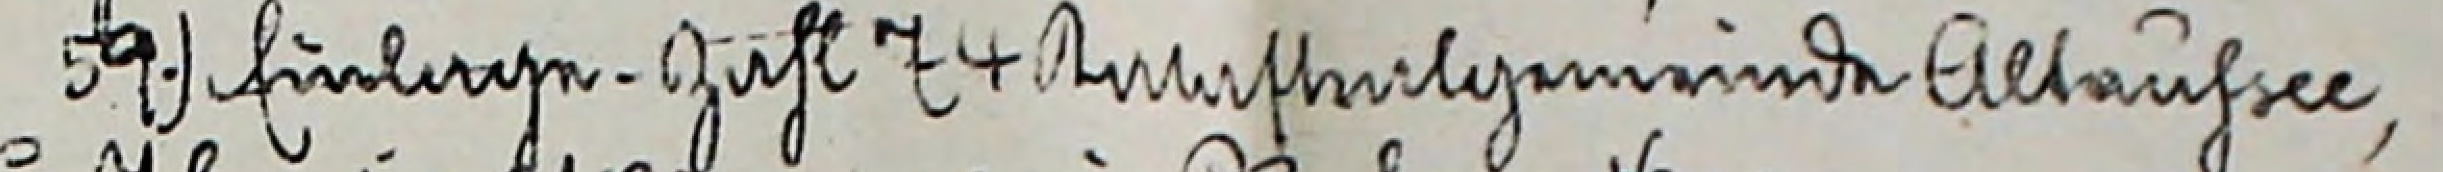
59.) Einlage - Zahl 74 Katastralgemeinde Altaussee,
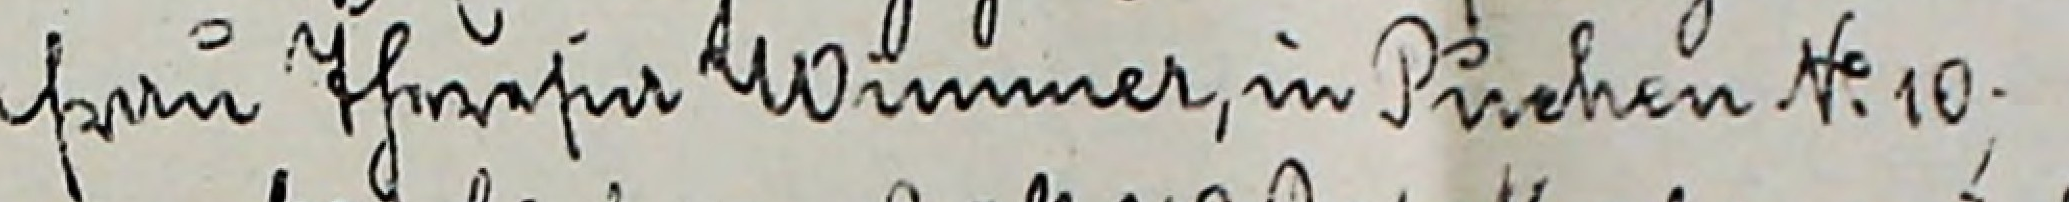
Frau Theresia Wimmer, in Puchen No 10;
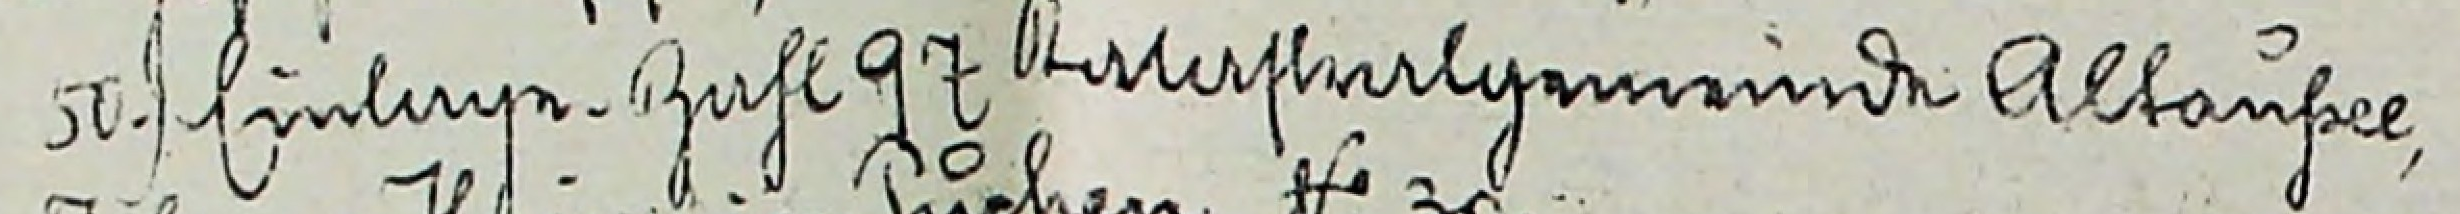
50.) Einlage - Zahl 97 Katastralgemeinde Altaussee,
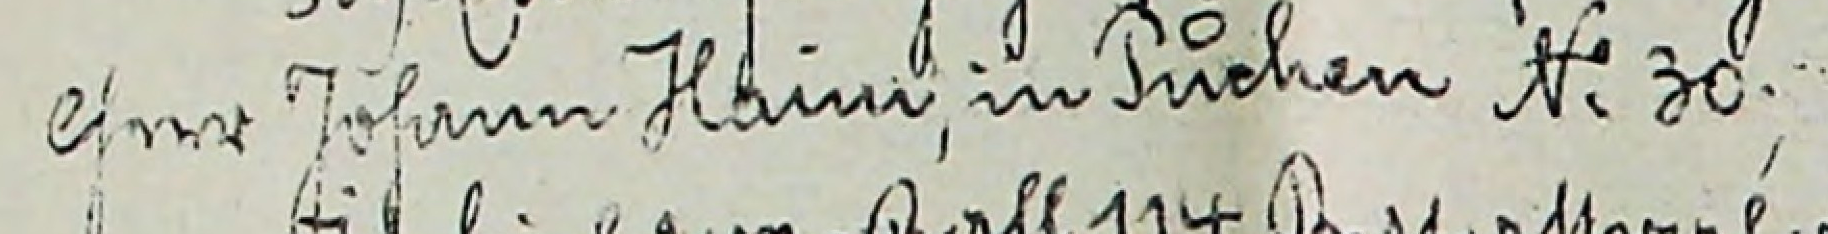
Herr Johann Haim, in Puchen No 30;
